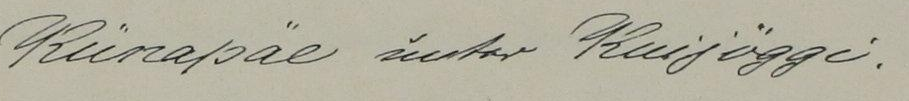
Künapäe unter Kuijöggi.
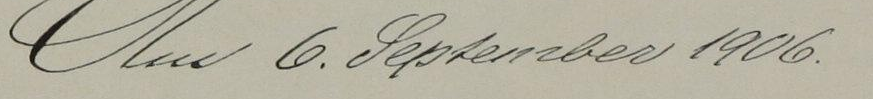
Am 6. September 1906.
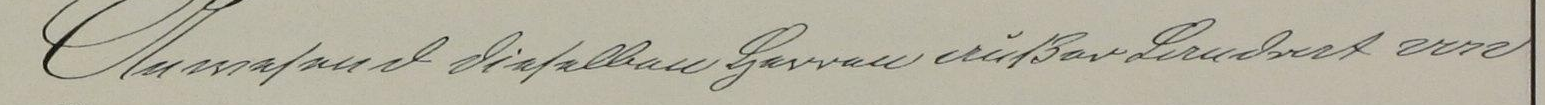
Anwesend dieselben Herren außer Landrat von
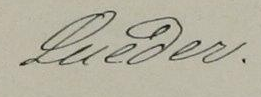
Lueder.
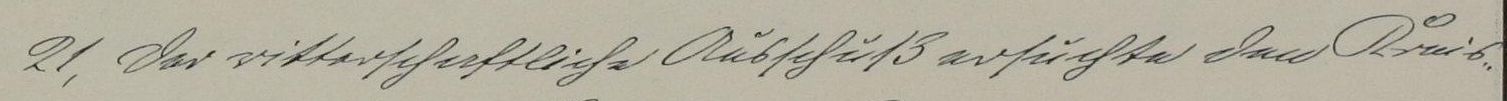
21. Der ritterschaftliche Ausschuß ersuchte den Kreis-
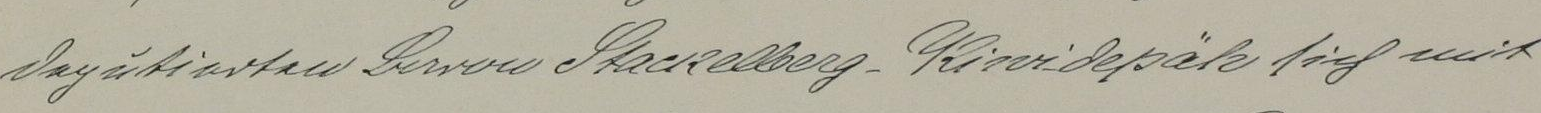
deputierten Baron Stackelberg-Kiwidepäh sich mit
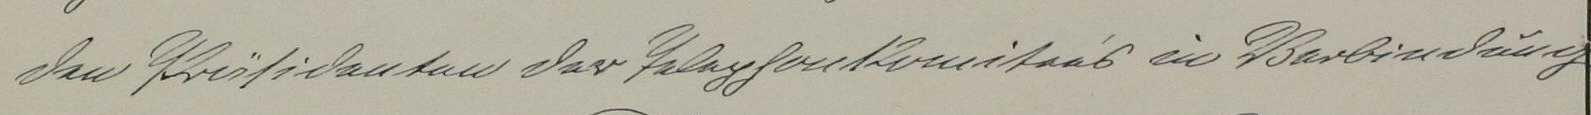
den Präsidenten der Telephonkomitees in Verbindung
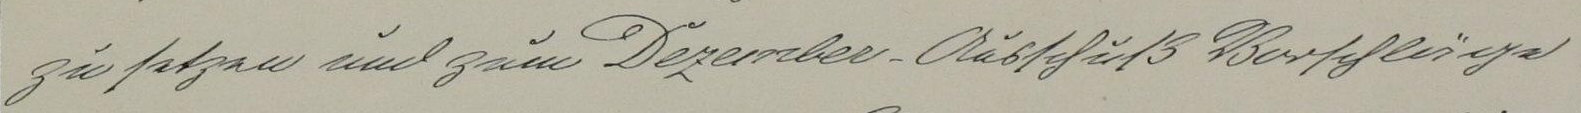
zu setzen und zum Dezember-Ausschuß Vorschläge
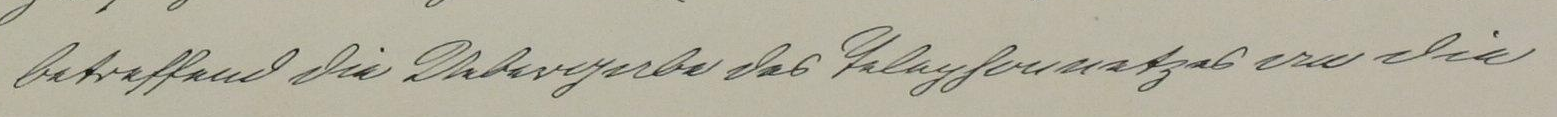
betreffend die Uebergabe des Telephonnetzes an die
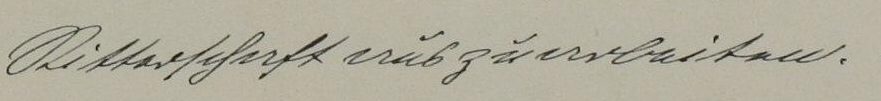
Ritterschaft auszuarbeiten.
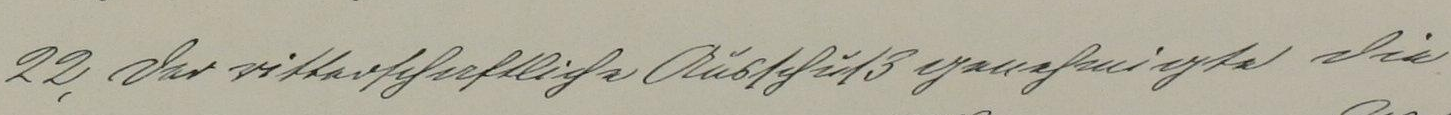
22. Der ritterschaftliche Ausschuß genehmigte die
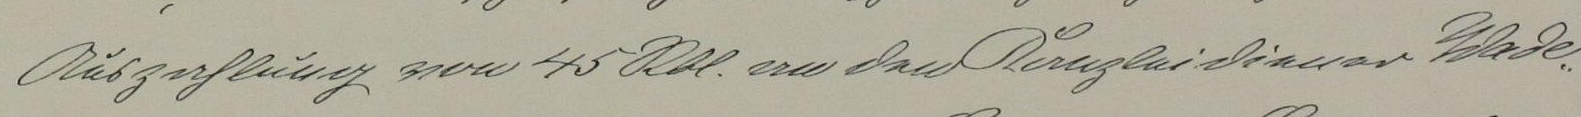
Auszahlung von 45 Rbl. an den Kanzleidiener Wade-
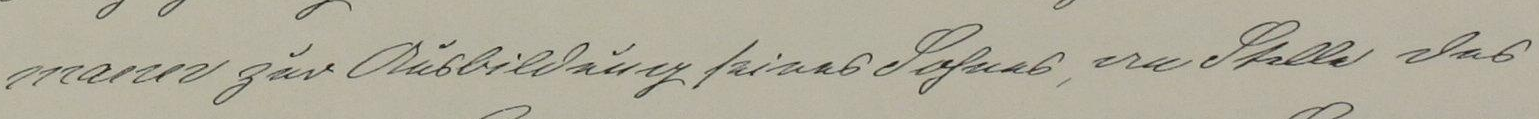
mann zur Ausbildung seines Sohnes, an Stelle des
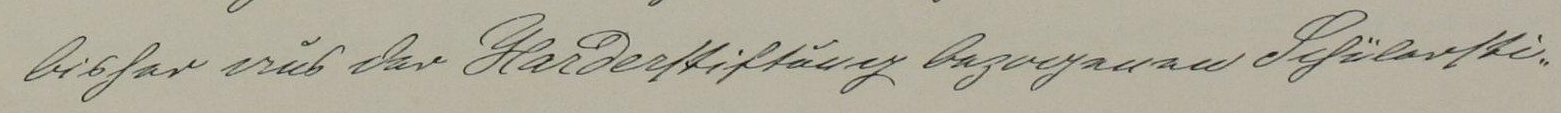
bisher aus der Harderstiftung bezogenen Schülersti-
